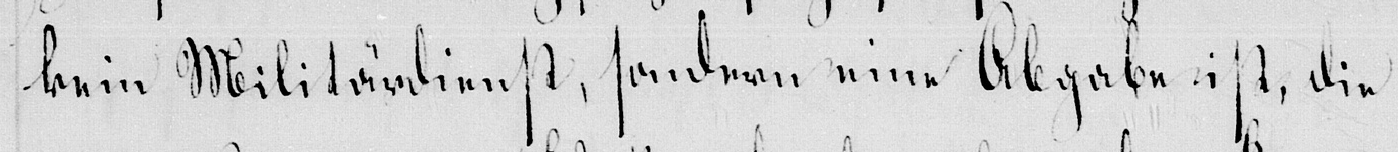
kein Militärdienst, sondern eine Abgabe ist, die
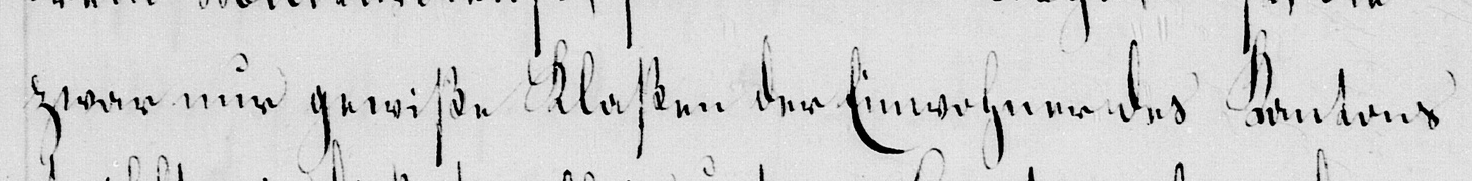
zwar nur gewiße Klaßen der Einwohner des Kantons
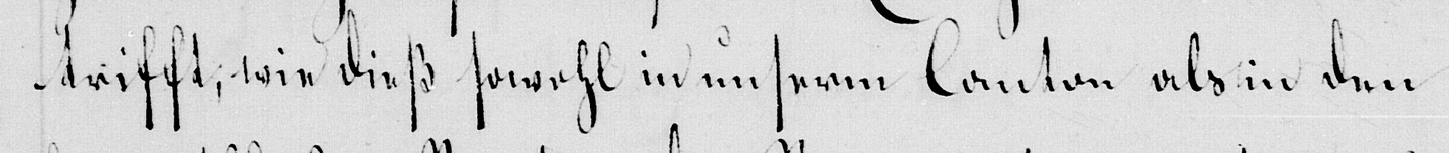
trifft, wie dieß sowohl in unserm Canton als in den
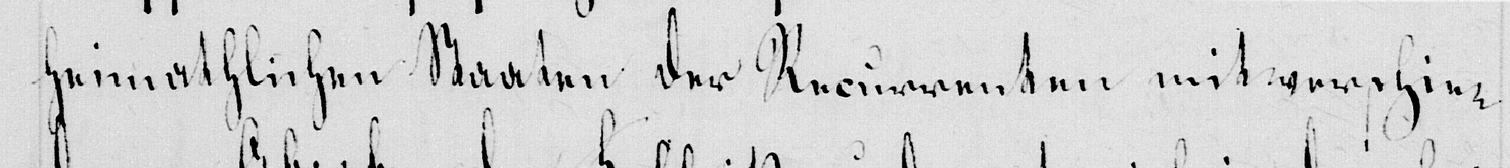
heimathlichen Staaten der Recurrenten mit verschie¬
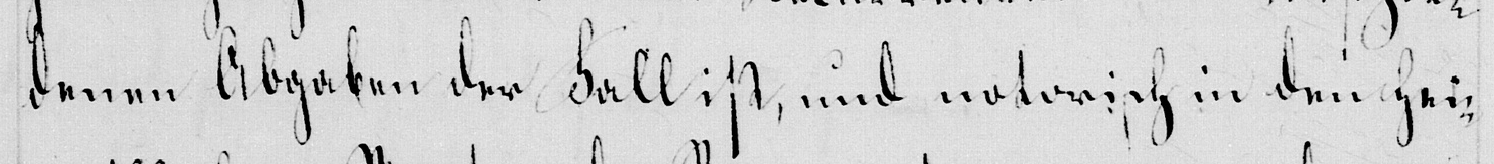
denen Abgaben der Fall ist, und notorisch in den hei¬
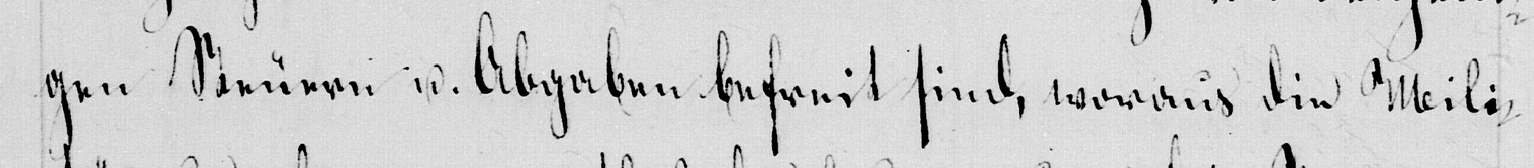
gen Steuern u. Abgaben befreit sind, woraus die Mili¬
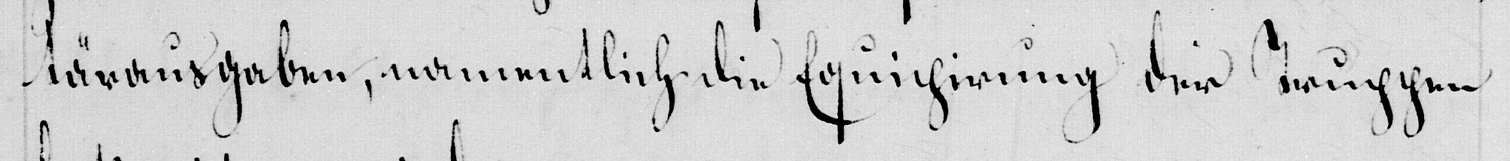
tärausgaben, namentlich die Equipirung der Truppen
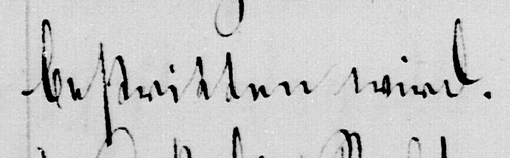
bestritten wird.
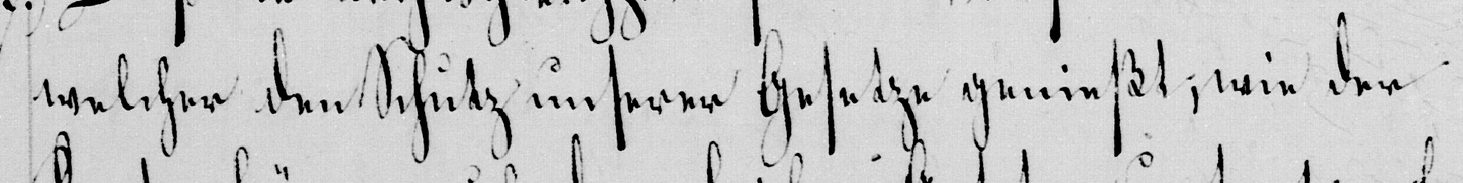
welcher den Schutz unserer Gesetze genießt, wie der
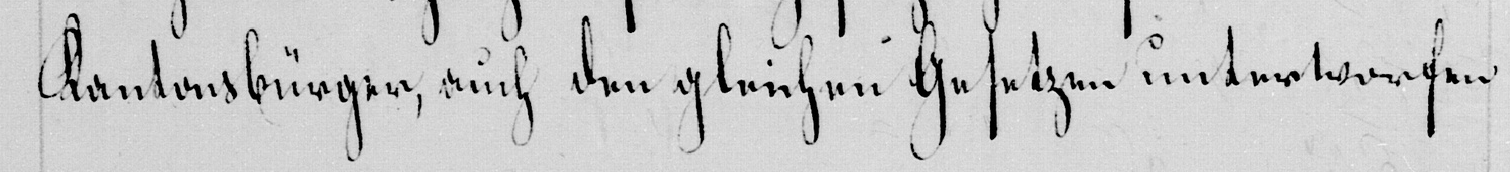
Kantonsbürger, auch den gleichen Gesetzen unterworfen
